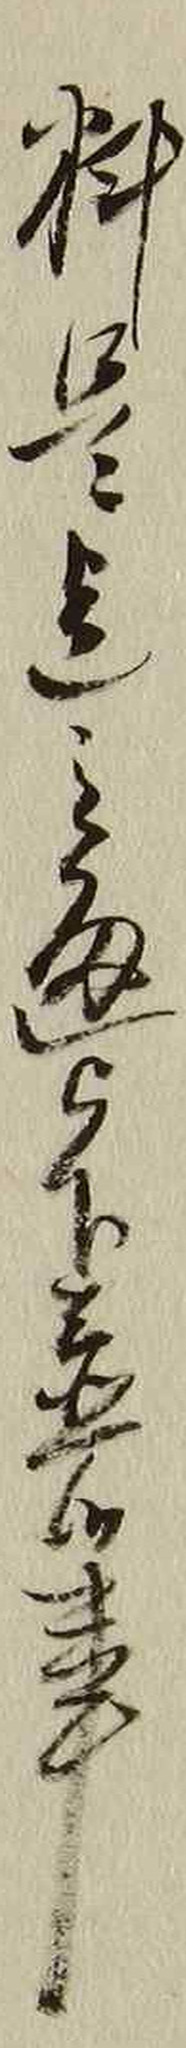料是迄之通被下置候事
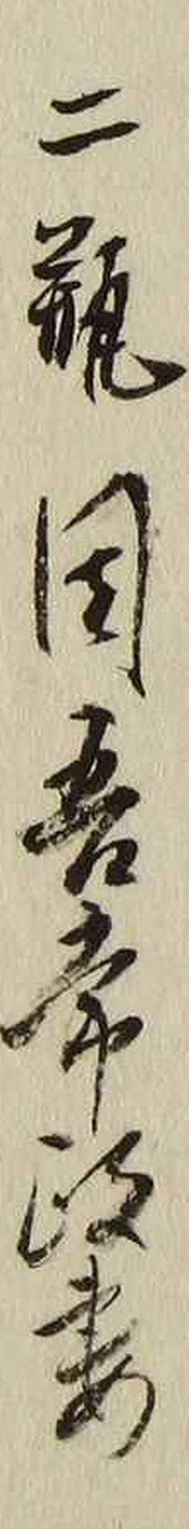女二瓶周吾常政妻

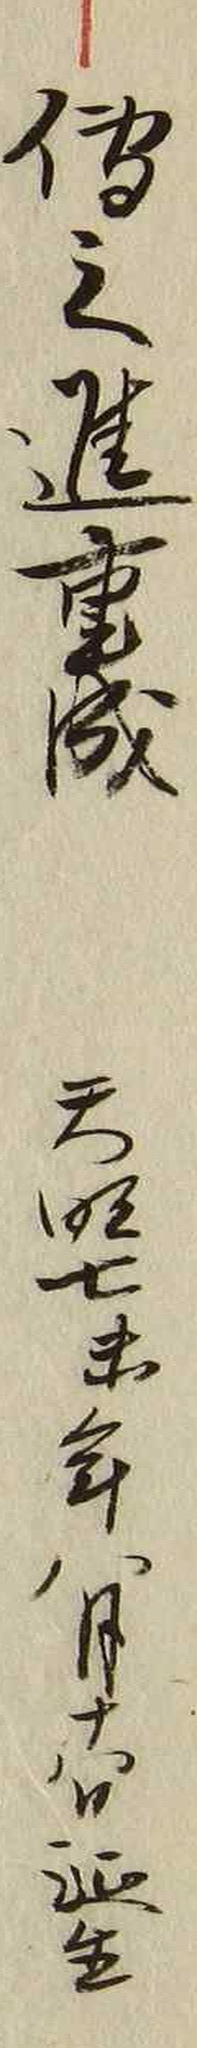伝之進重成天明七未年八月十ハ日誕生
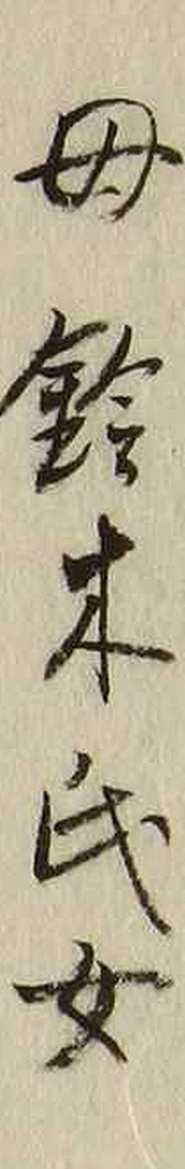母鈴木氏女
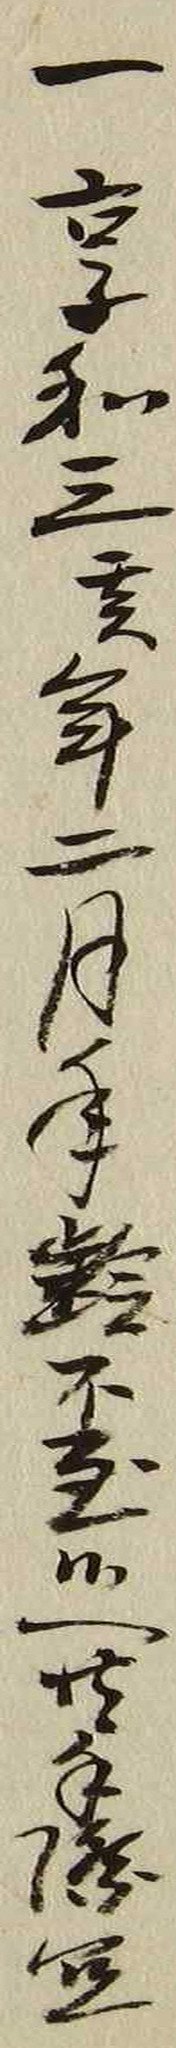一享和三亥年二月年齢不至候へ共手際宜
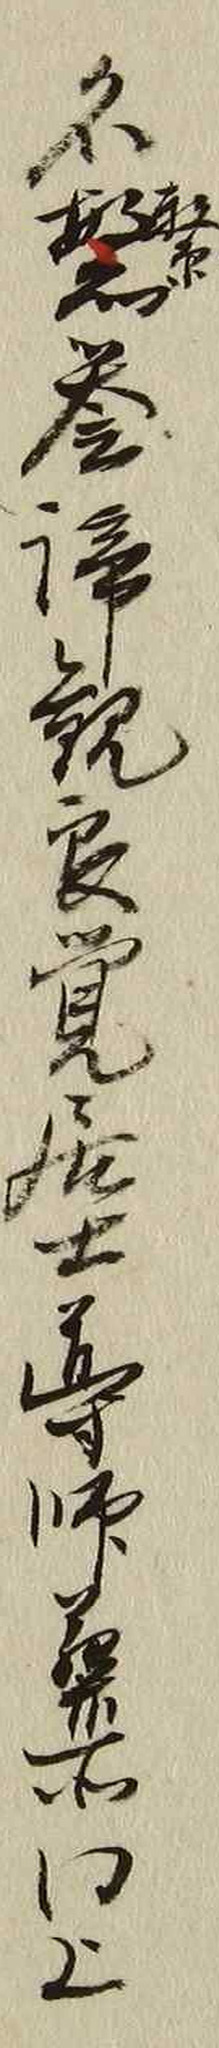名繋誉諦観良覚居士導師葬所同上
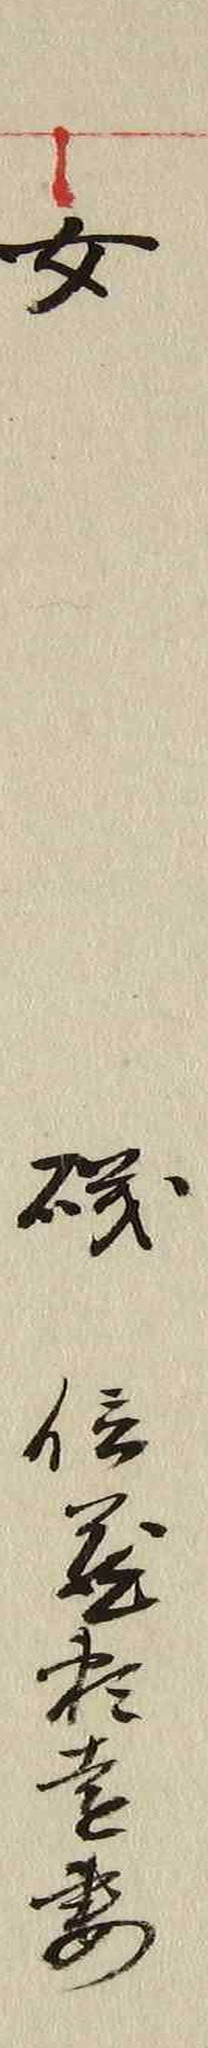女磯信蔵頼遠妻
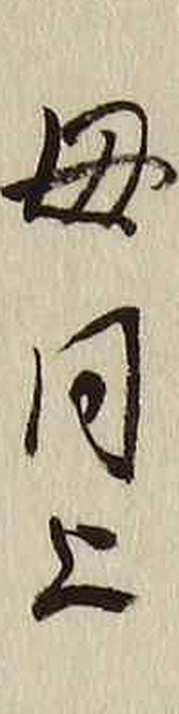母同上
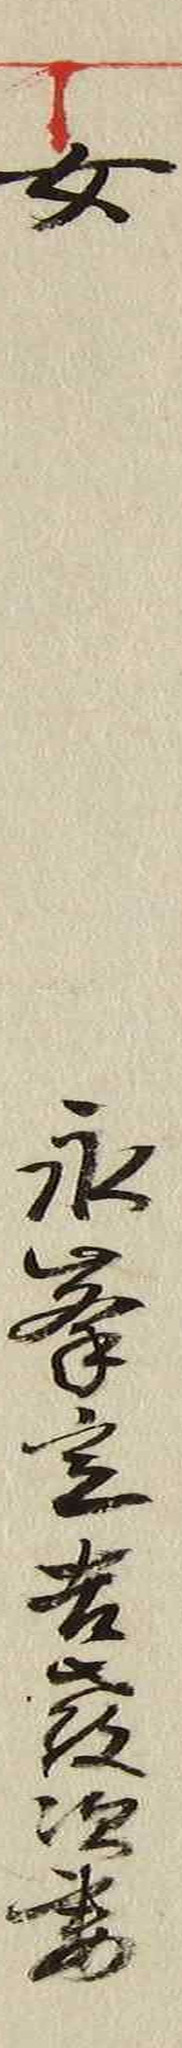女永峰定吉教次妻
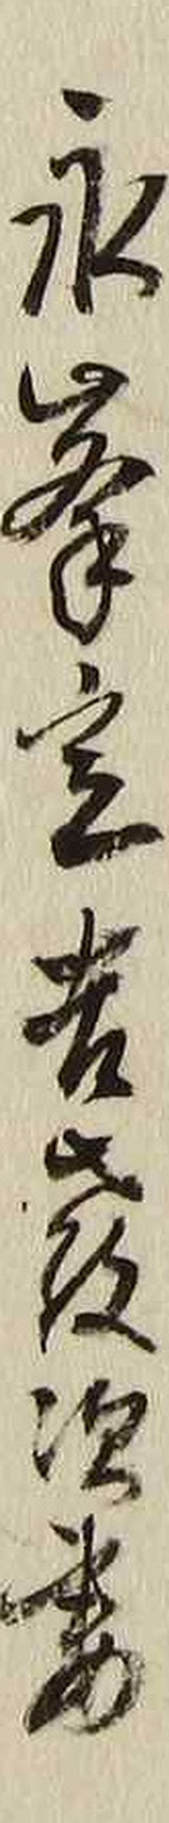女永峰定吉教次妻
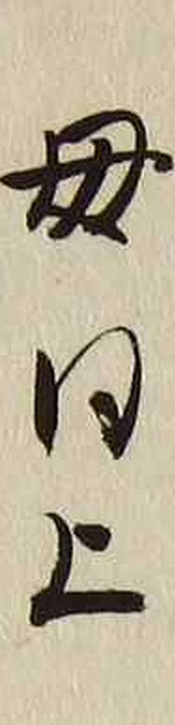母同上
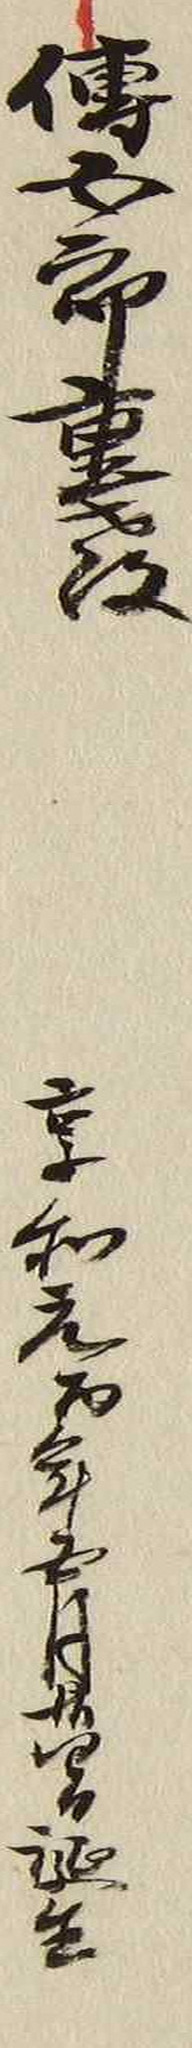伝五郎重教享和元酉年五月廿四日誕生
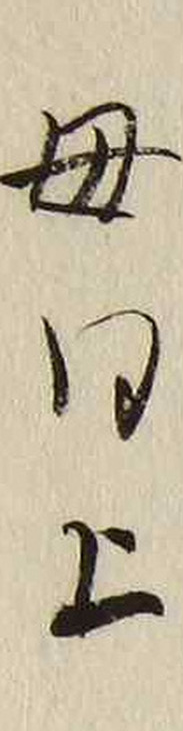母同上

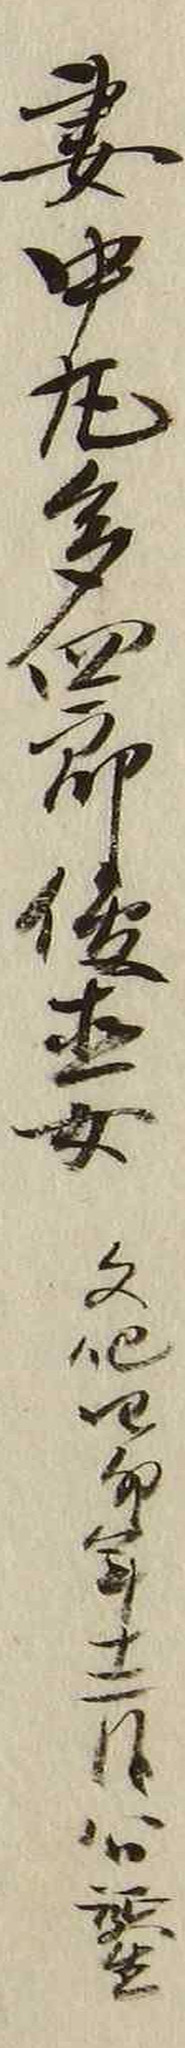妻中丸多四郎俊直女文化四卯年十二月八日誕生
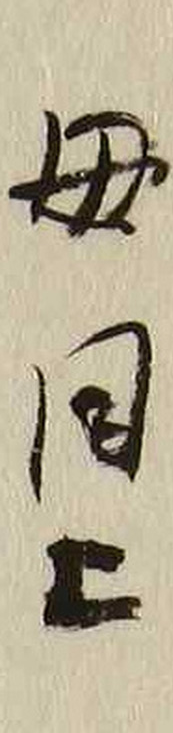母同上

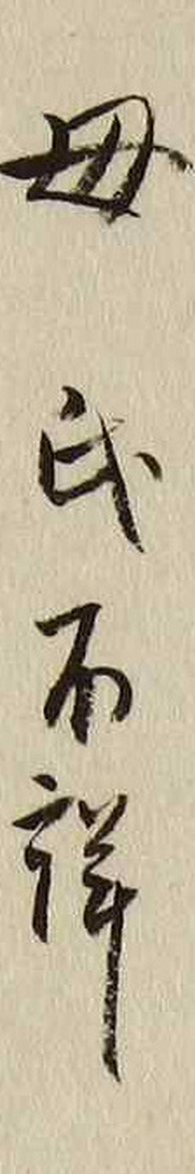母氏不詳
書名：諸士系譜　巻之350　せ之部1冊全
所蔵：会津若松市立会津図書館
